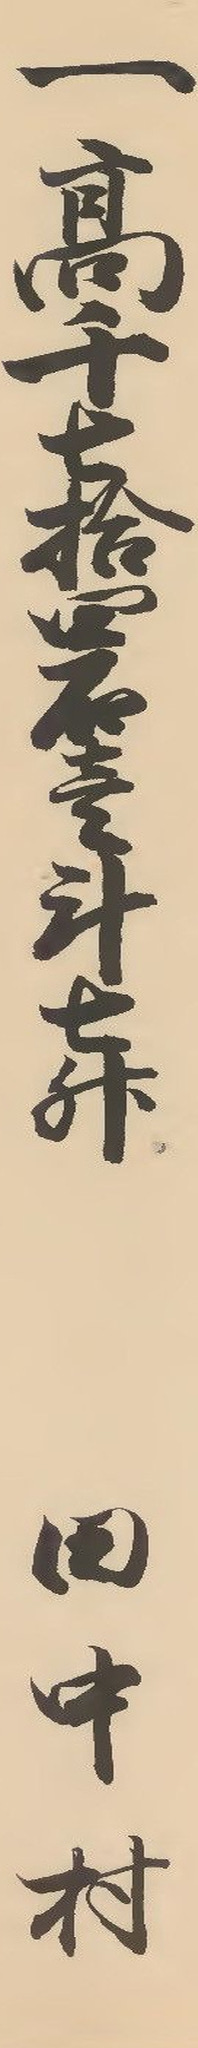一髙千七拾四石壱斗七升田中村
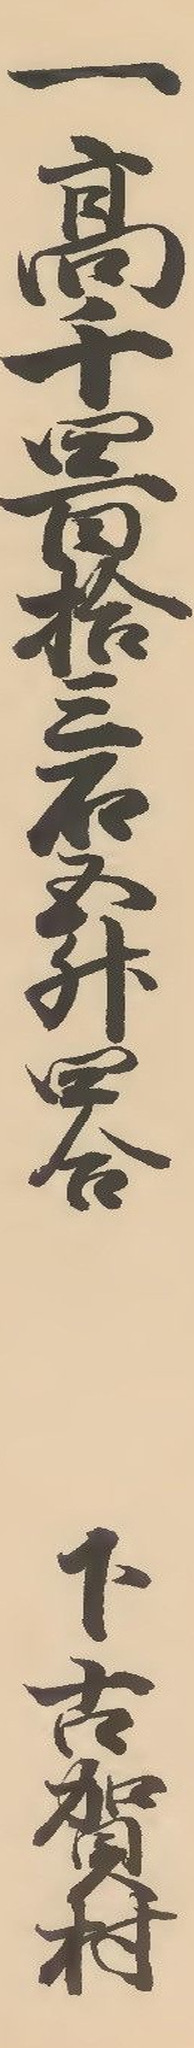一髙千四百拾三石五升四合下古賀村

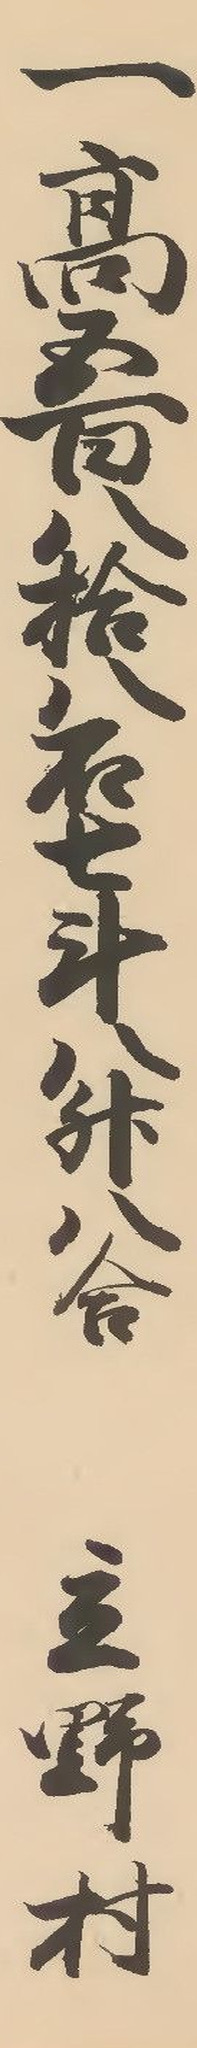一髙五百八拾八石七斗八升八合立野村
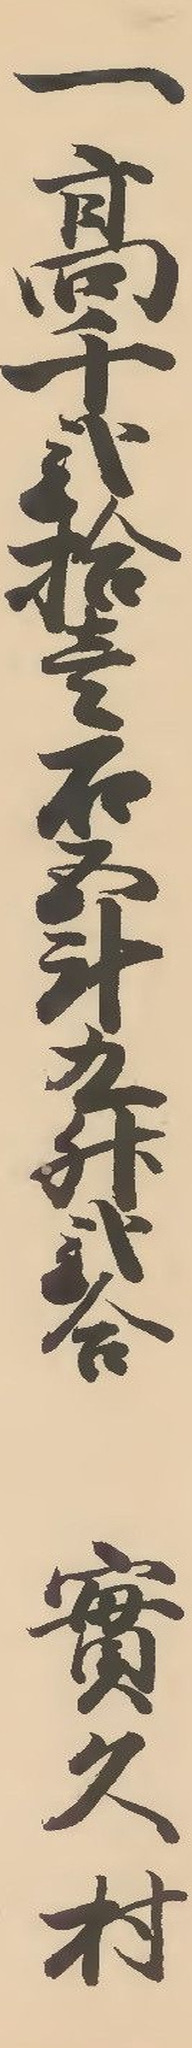一髙千弐拾壱石五斗九升弐合實久村
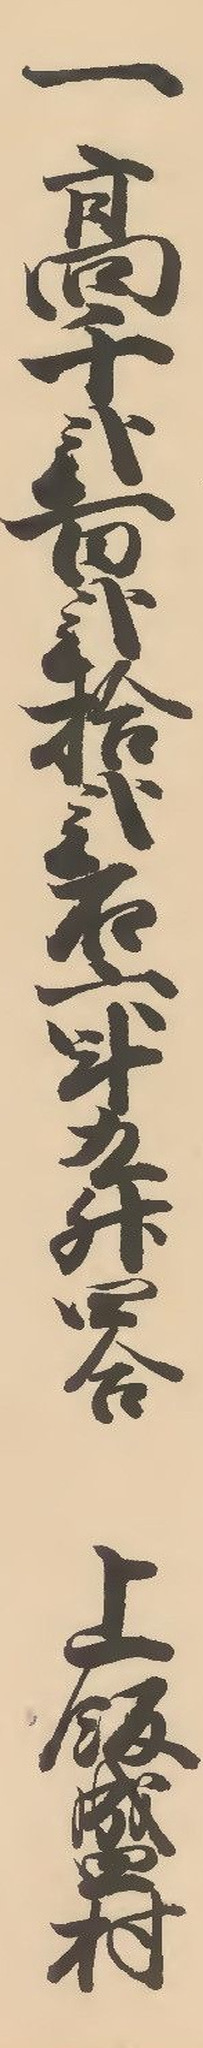一髙千弐百弐拾弐石六斗九升四合上飯盛村
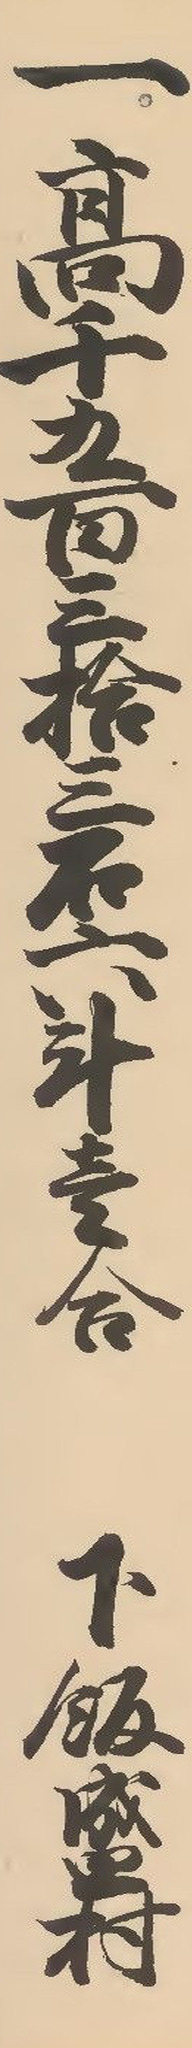一髙千九百三拾三石六斗壱合下飯盛村
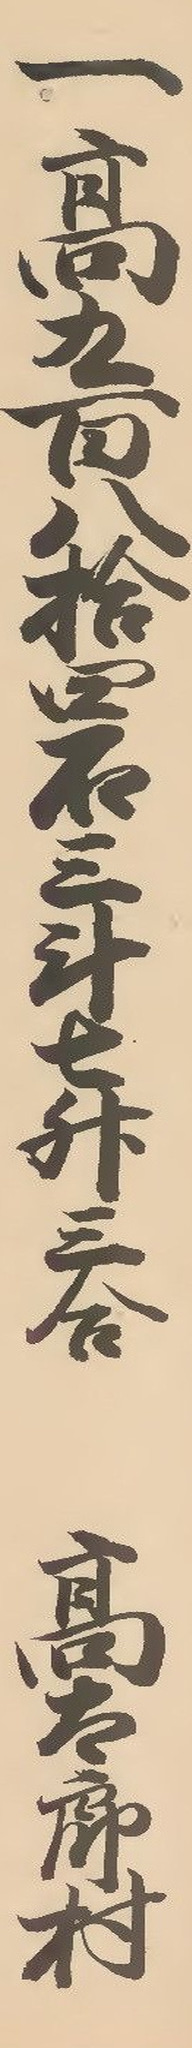一髙九百八拾四石三斗七升三合髙太郎村
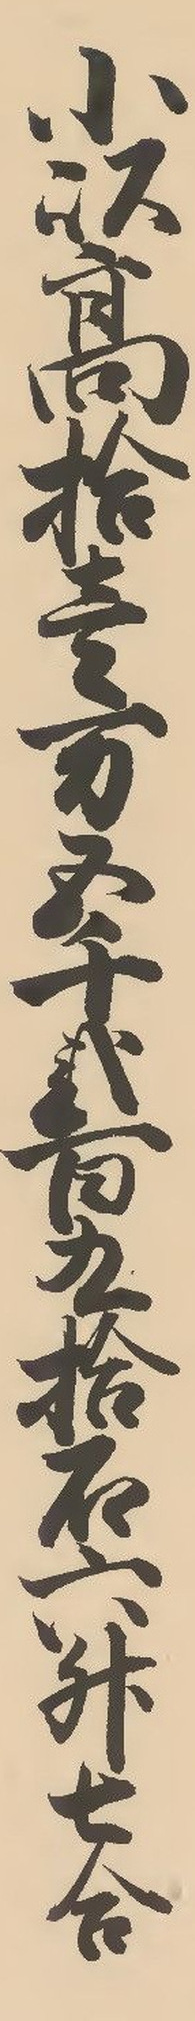小以髙拾壱万五千弐百九拾石六升七合

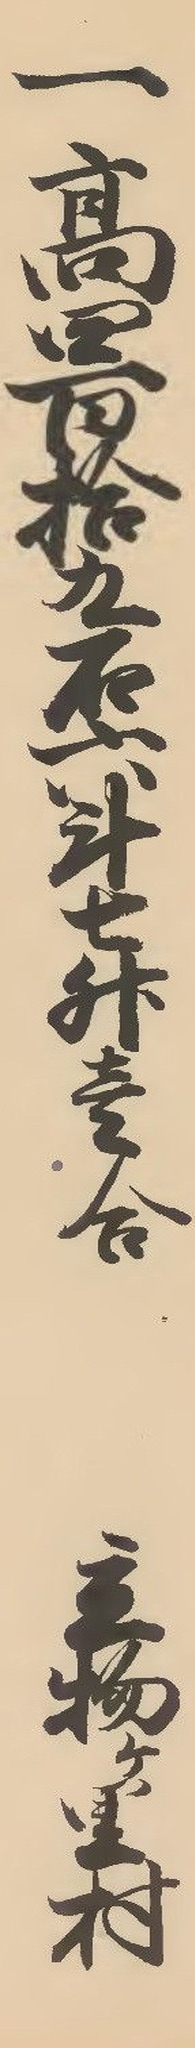一髙四百拾九石六斗七升壱合立物ケ里村
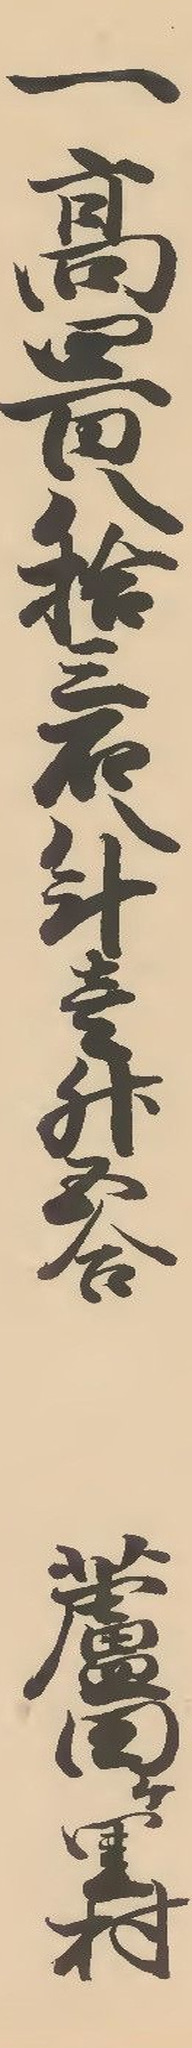一髙四百八拾三石八斗壱升五合蘆田ケ里村
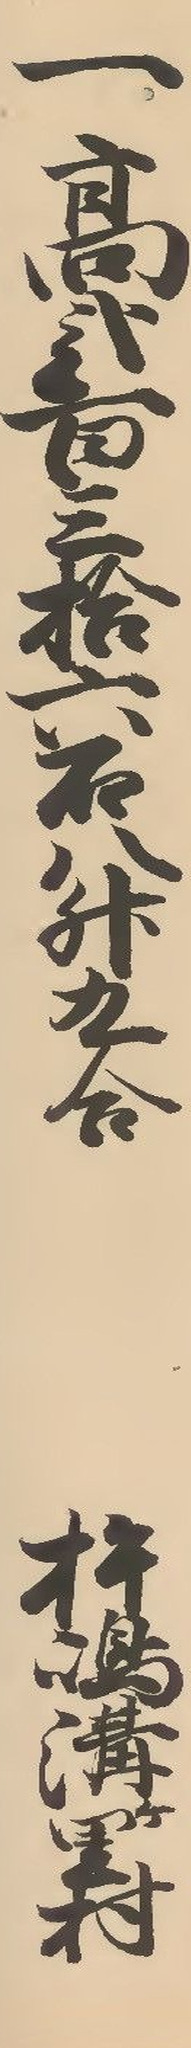一髙弐百三拾六石八升九合杵島溝ケ里村
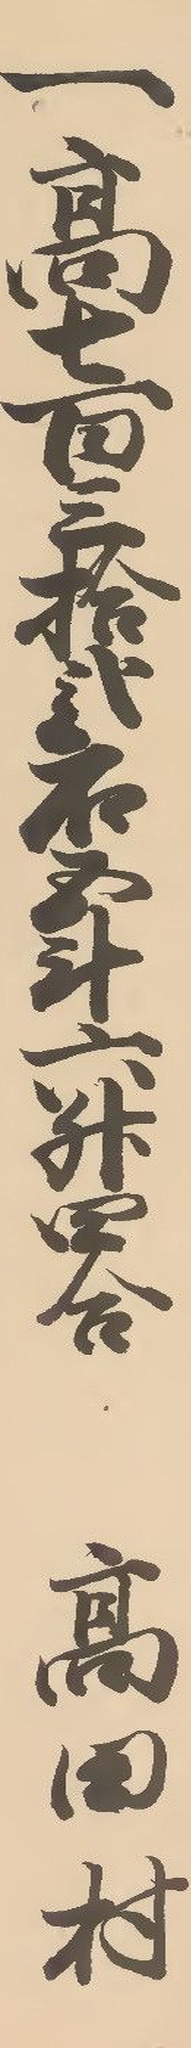一髙七百三拾弐石五斗六升四合髙田村
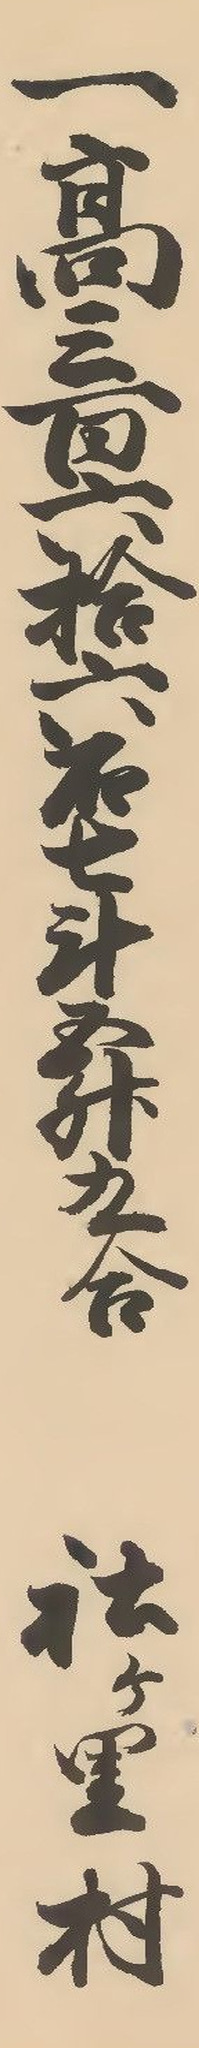一髙三百六拾六石七斗五升九合社ケ里村
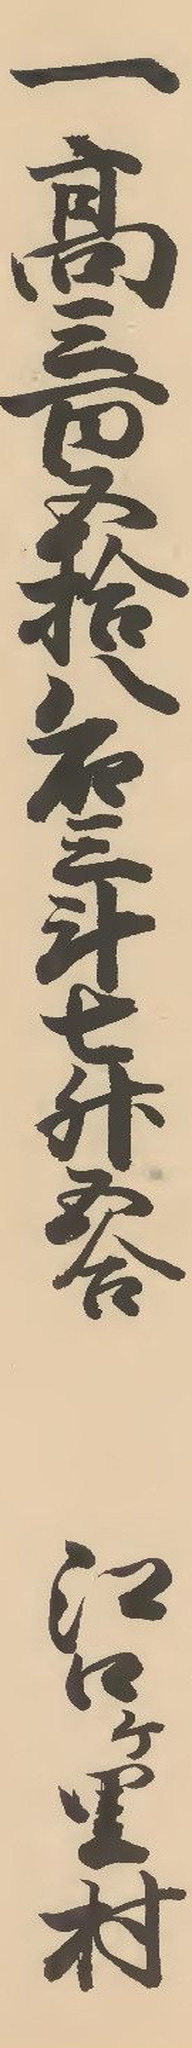一髙三百五拾八石三斗七升五合江口ケ里村
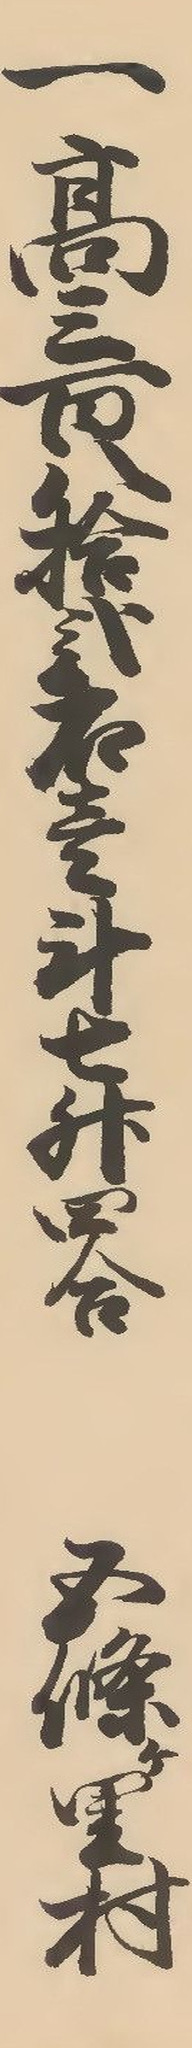一髙三百八拾弐石壱斗七升四合五條ケ里村

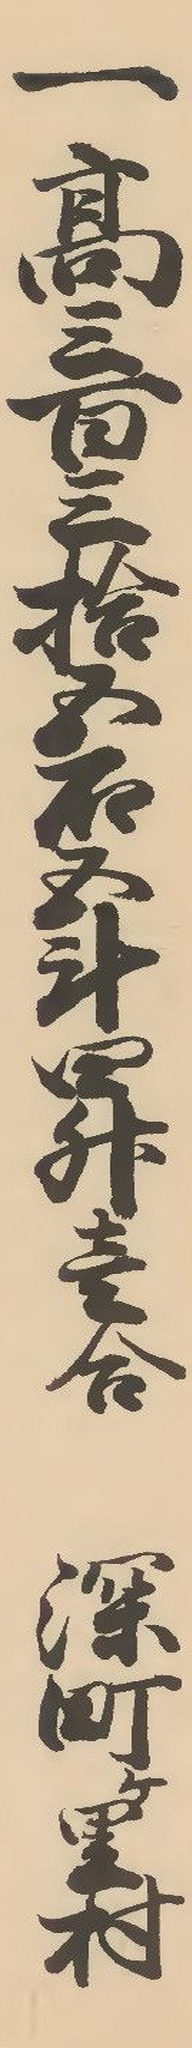一髙三百三拾五石五斗四升壱合深町ケ里村
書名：肥前国郷帳
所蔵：国立公文書館 National Archives of Japan
